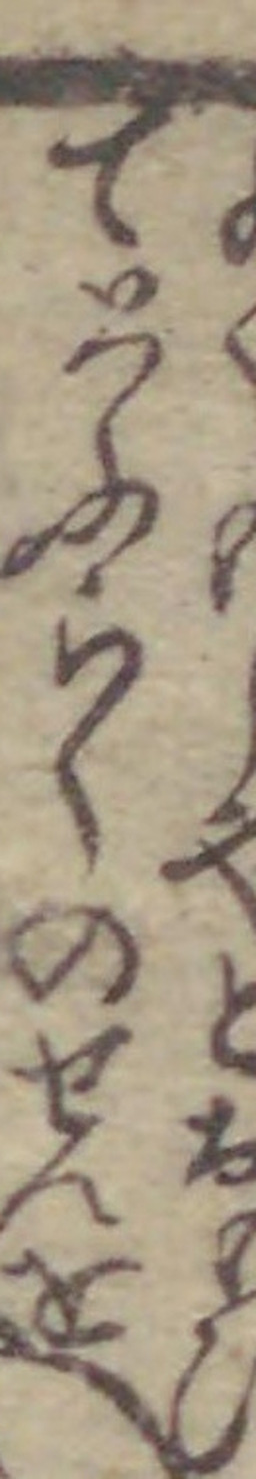てとふらくのせんを
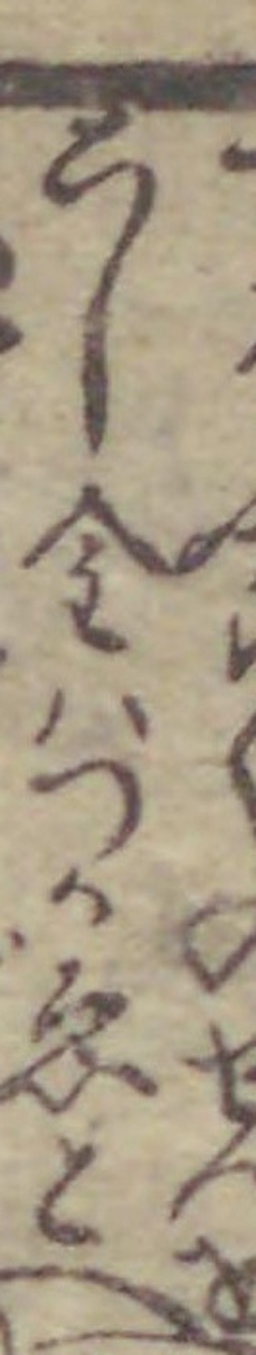こし金はつかゑと
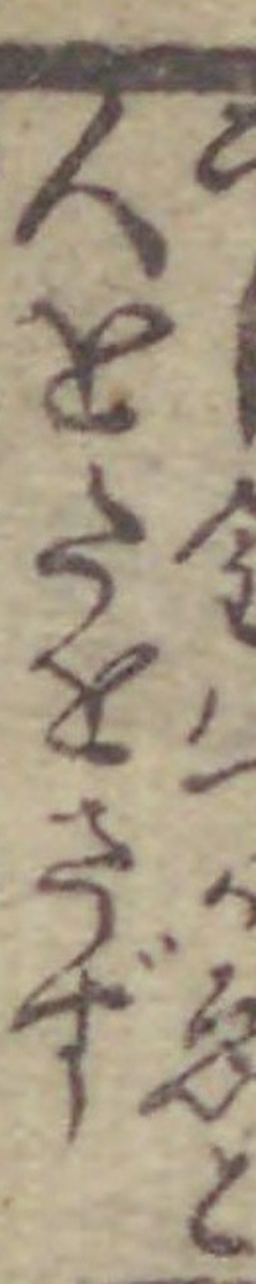人をたをさず
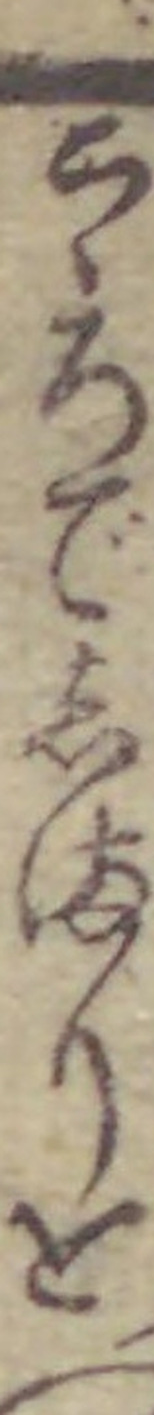こゝろでしまりを
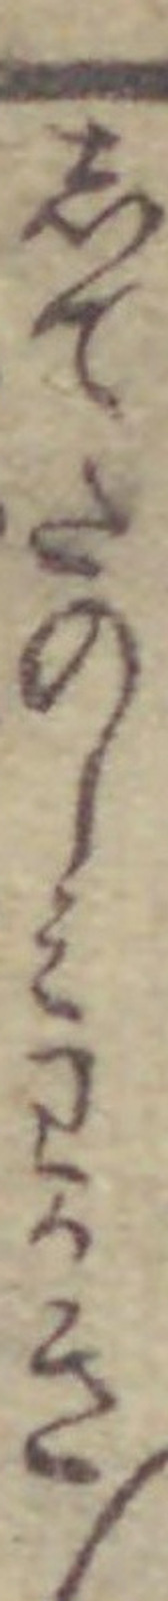してたのしみわかき
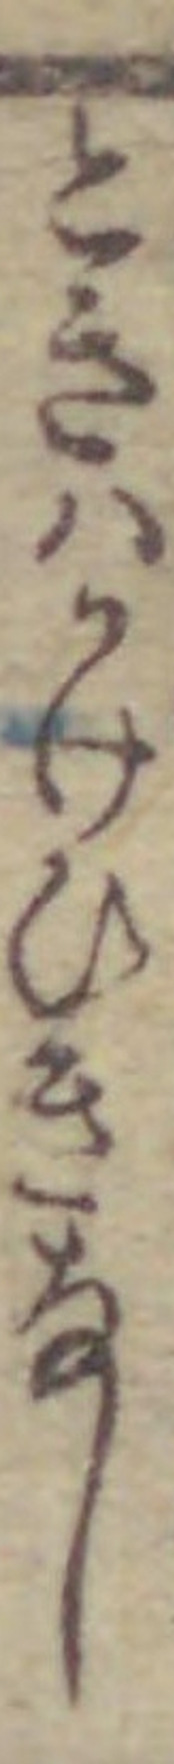ときはかけひきなし
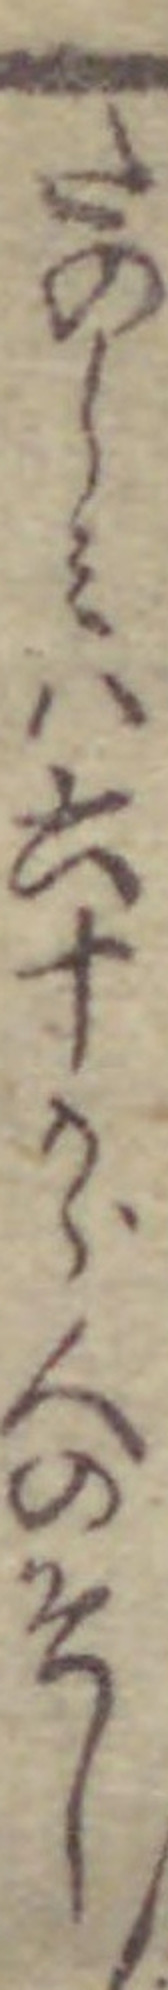たのしみは六十から人のそし
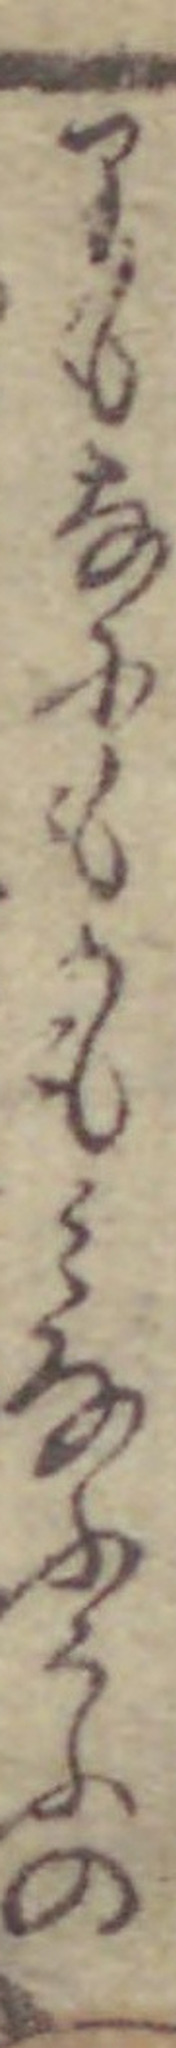りもなにもかもみなふうふの
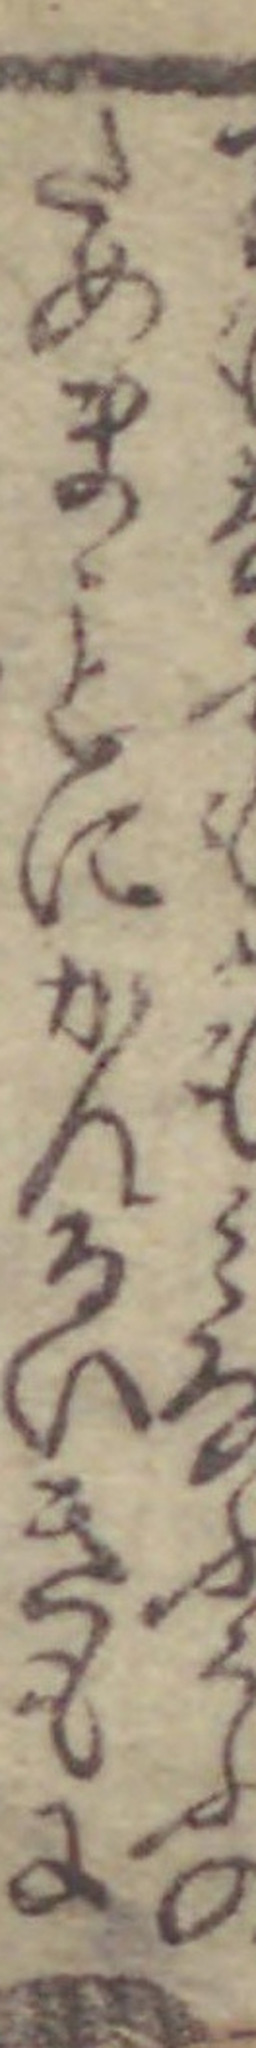ためまことにかんるいきもに
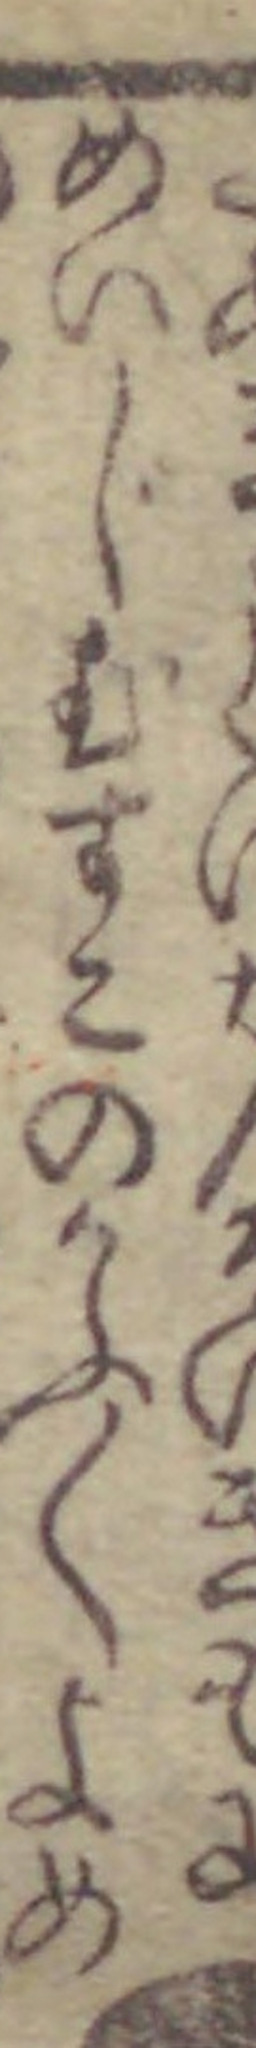めいじむすこのかふ〳〵よめ
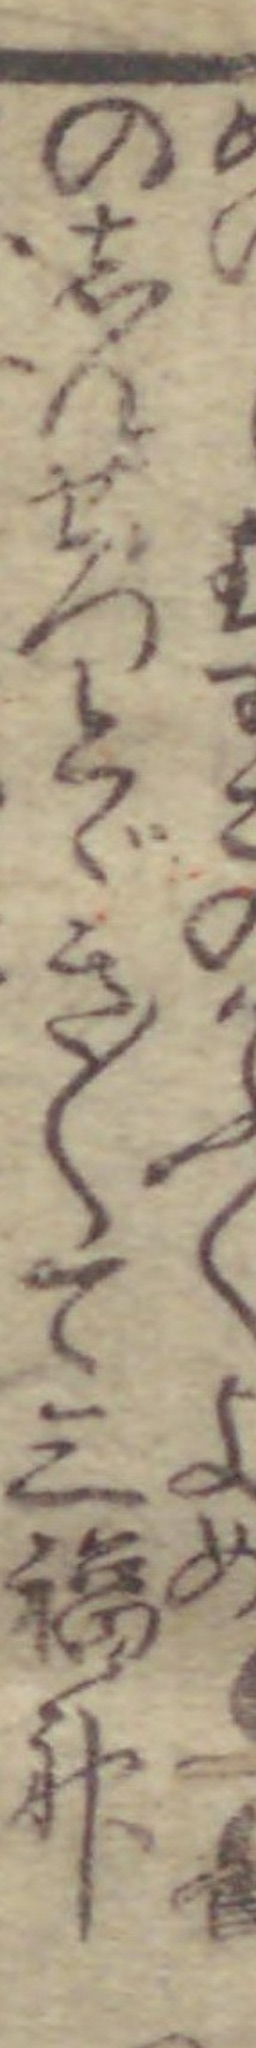のしんせつとゞき〳〵て三福神
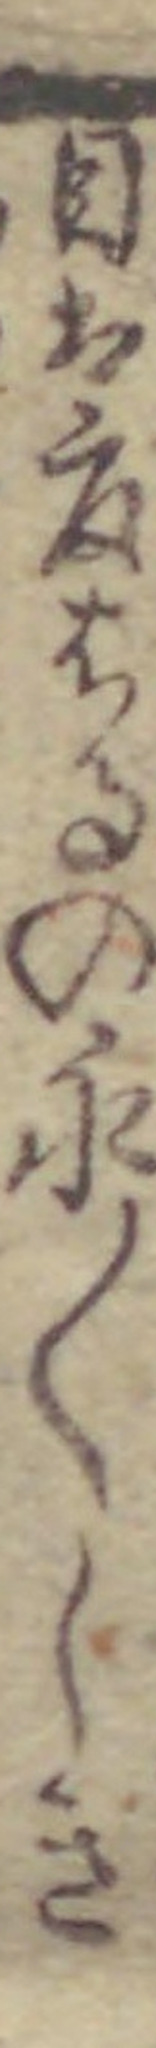目出度はるの永〳〵しき
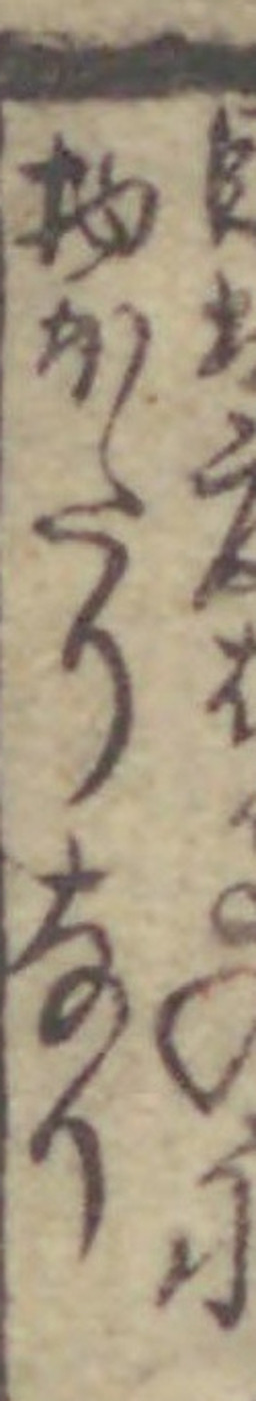物かたりなり
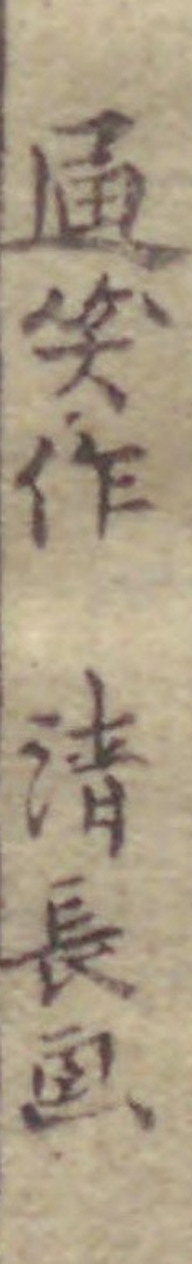通笑作清長画
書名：親父布子鳶握 3巻
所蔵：国立国会図書館 National Diet Library, JAPAN
